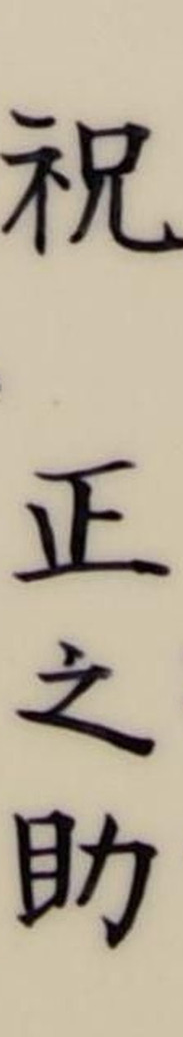祝正之助
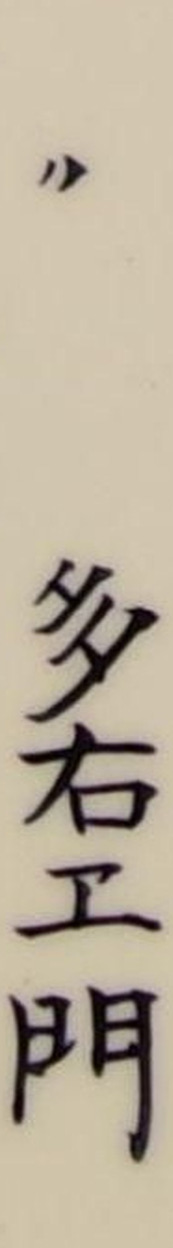多右エ門
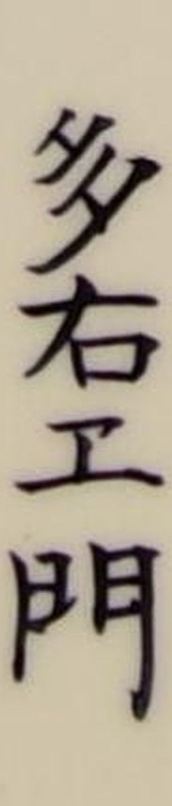多右エ門
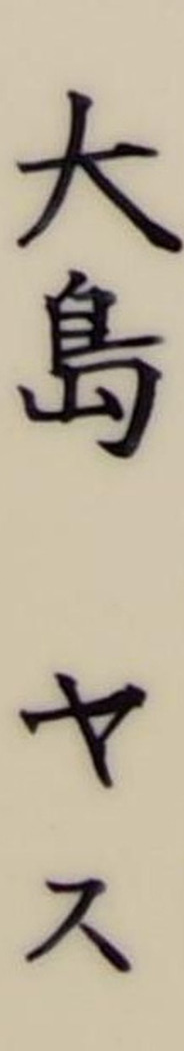大島ヤス
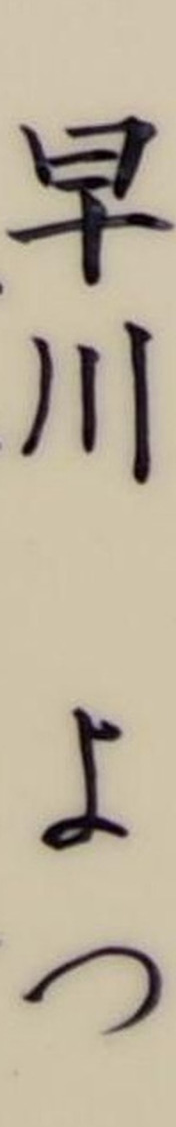早川よつ
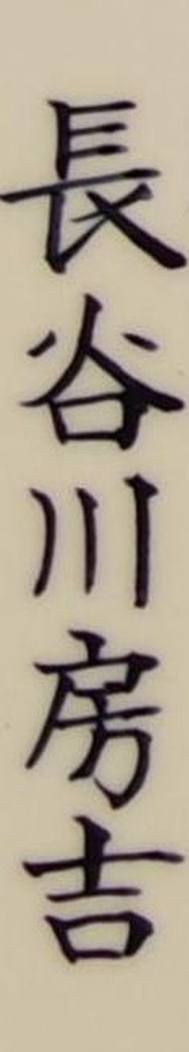長谷川房吉

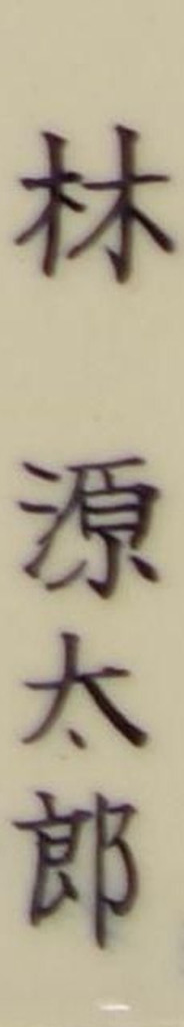林源太郎
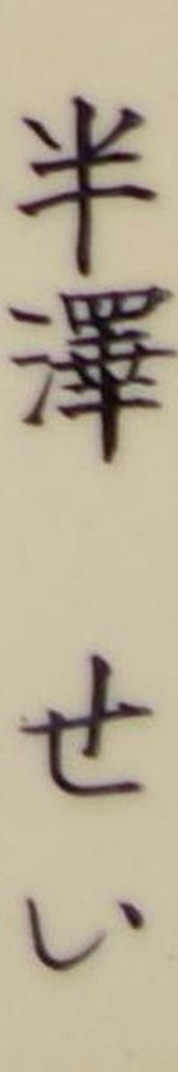半澤せい
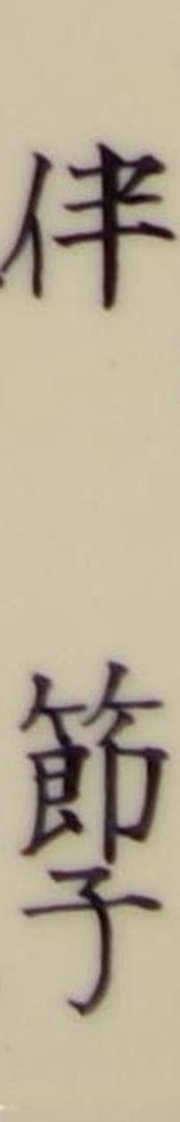伴節子
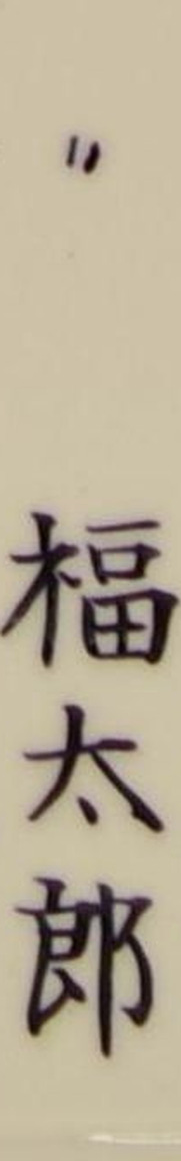福太郎
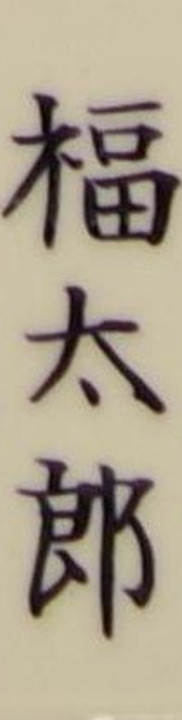福太郎
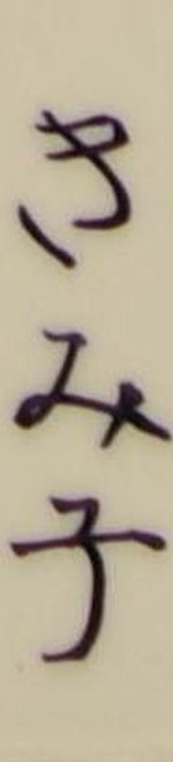きみ子
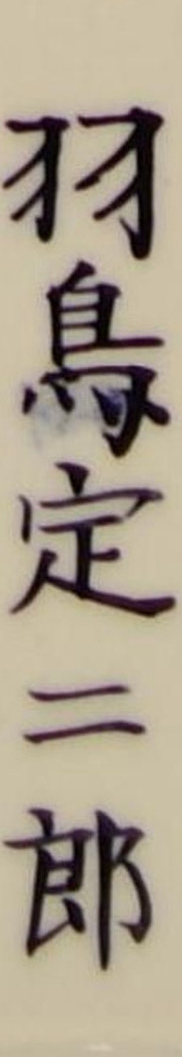羽鳥定二郎
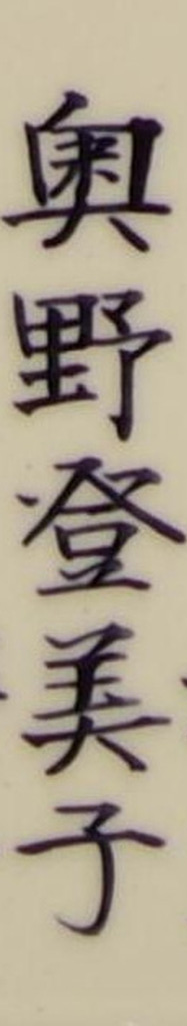奥野登美子
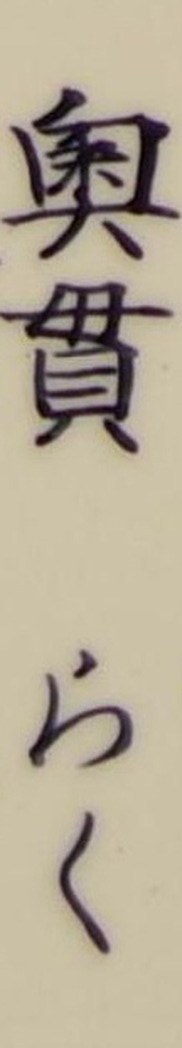奥貫らく
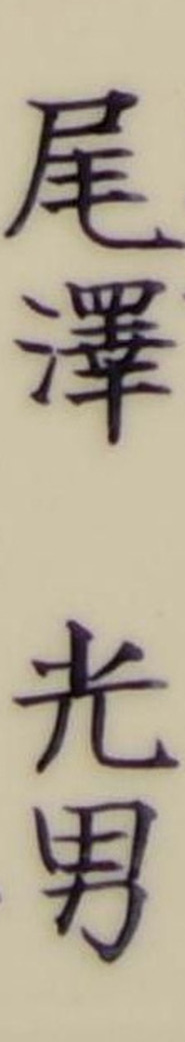尾澤光男
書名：E~L
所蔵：高野山金剛峯寺
